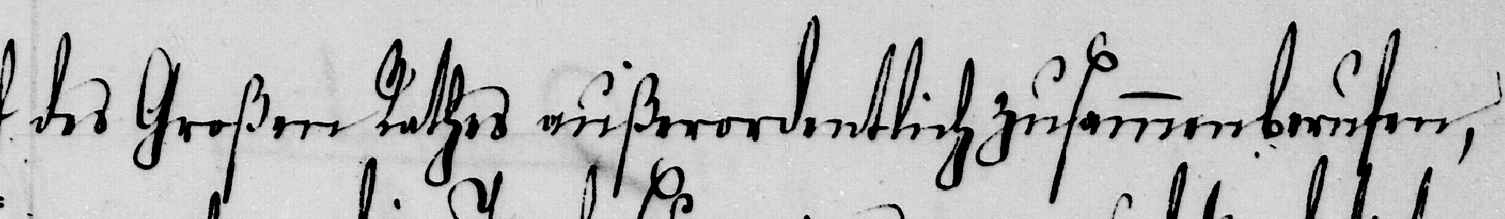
des Großen Rathes außerordentlich zusammen berufen,
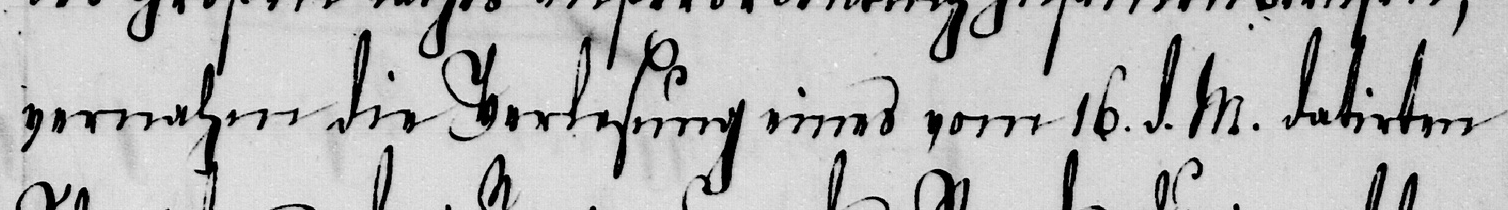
vernahm die Verlesung eines vom 16. d. M .datirten
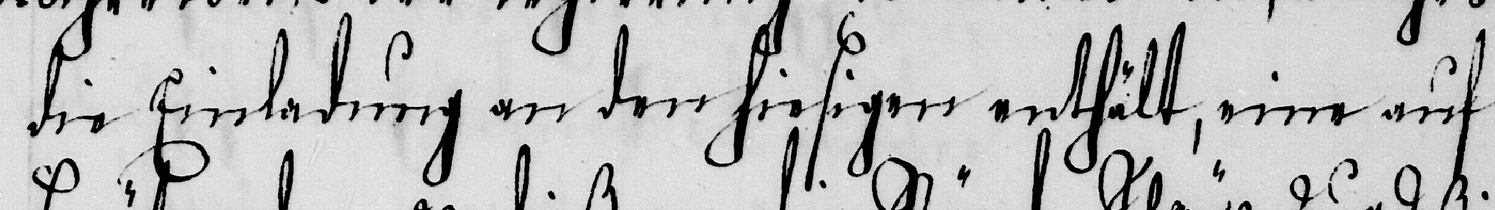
die Einladung an den hiesigen enthält, eine auf
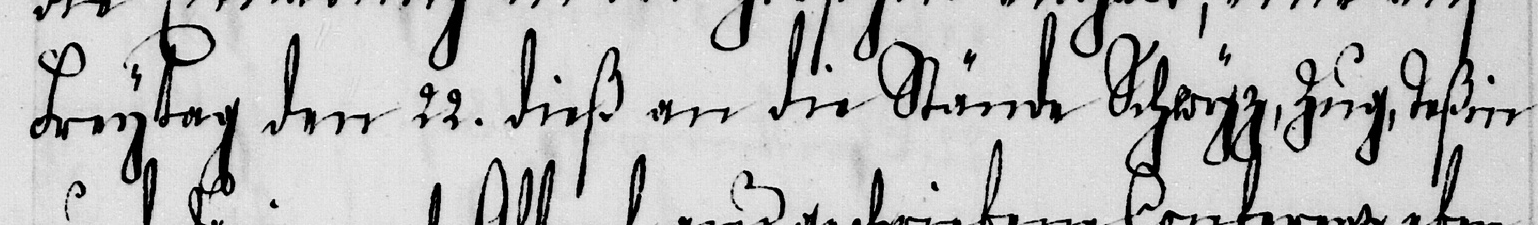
Freytag den 22. dieß an die Stände Schwyz, Zug, Teßin
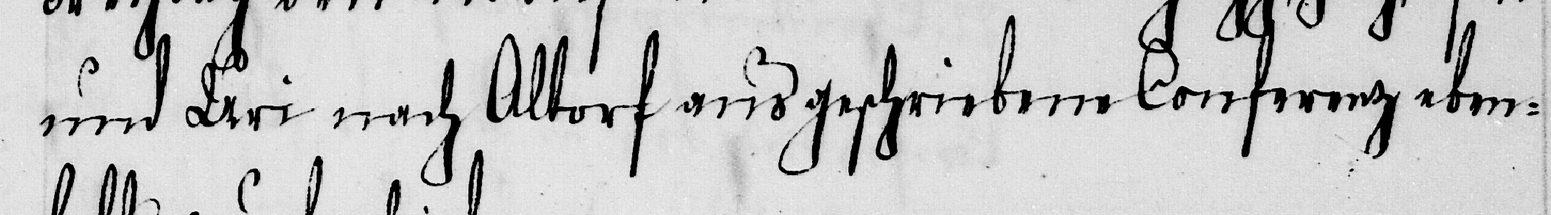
und Uri nach Altorf ausgeschriebene Conferenz eben¬
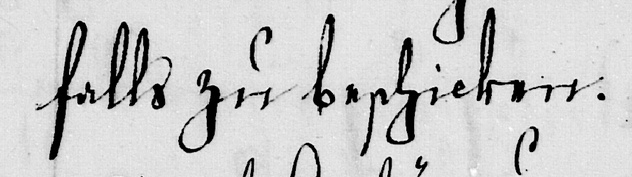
falls zu beschicken.
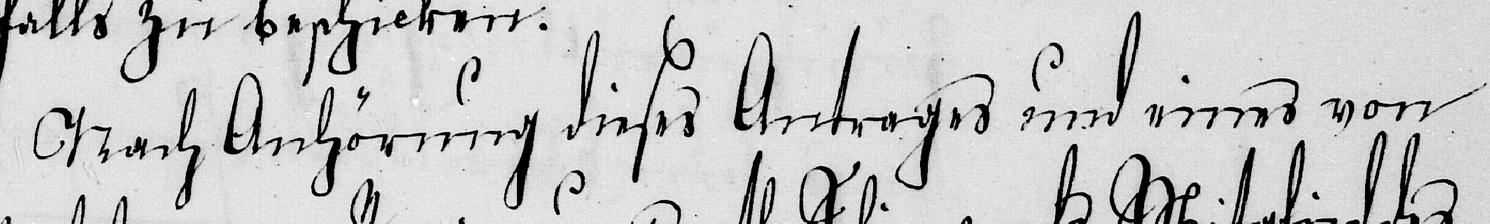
Nach Anhörung dieses Antrages und eines von
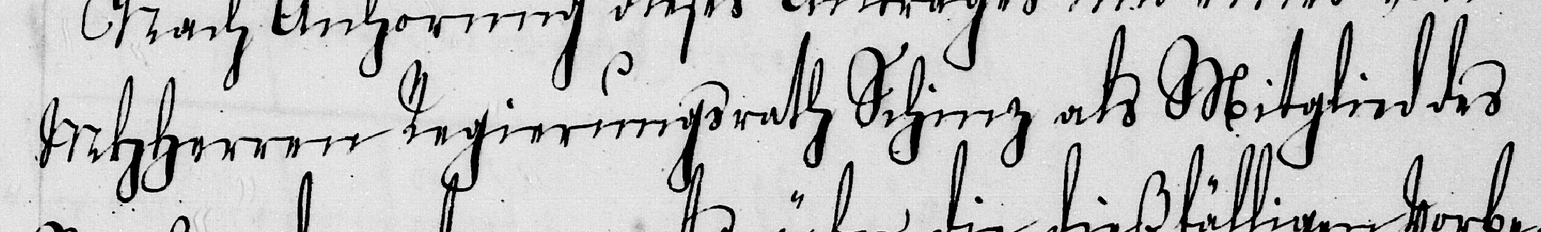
MHHerrn Regierungsrath Schinz als Mitglied des
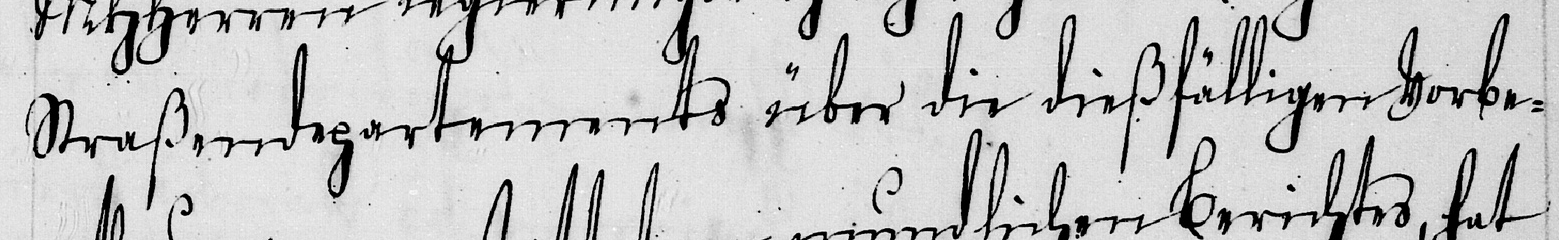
Straßendepartements über die dießfälligen Vorbe¬
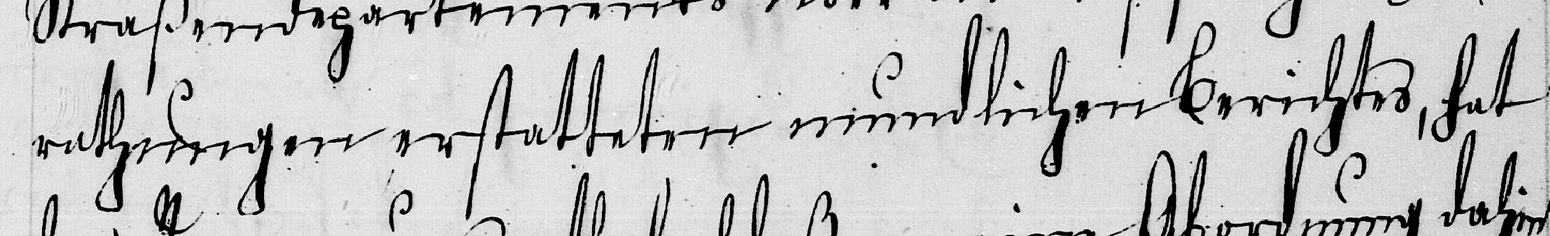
rathungen erstatteten mündlichen Berichtes, hat
